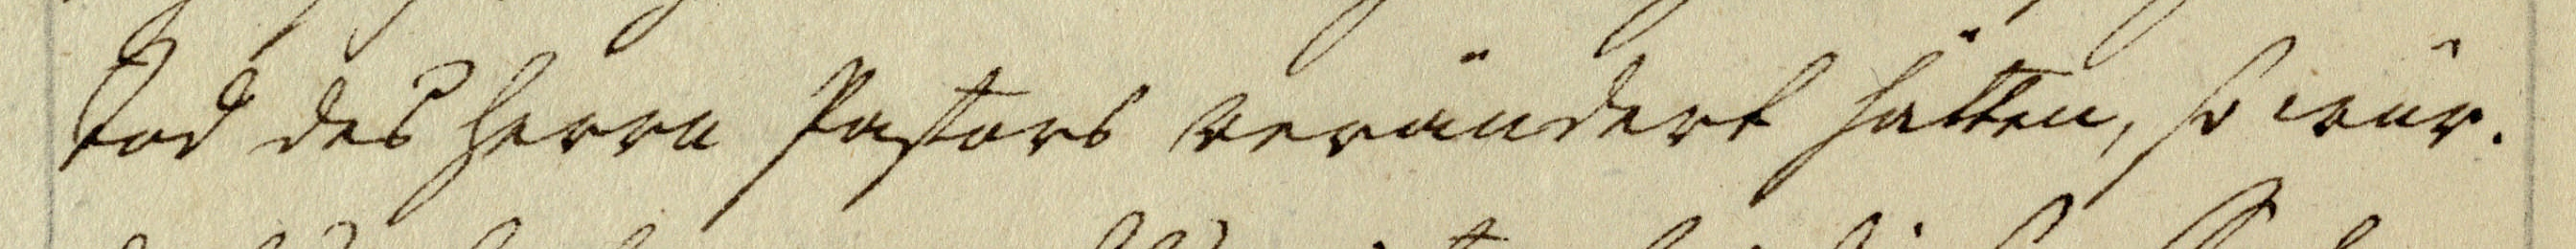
Tod des Herrn Pastors verändert hätten, so wür¬
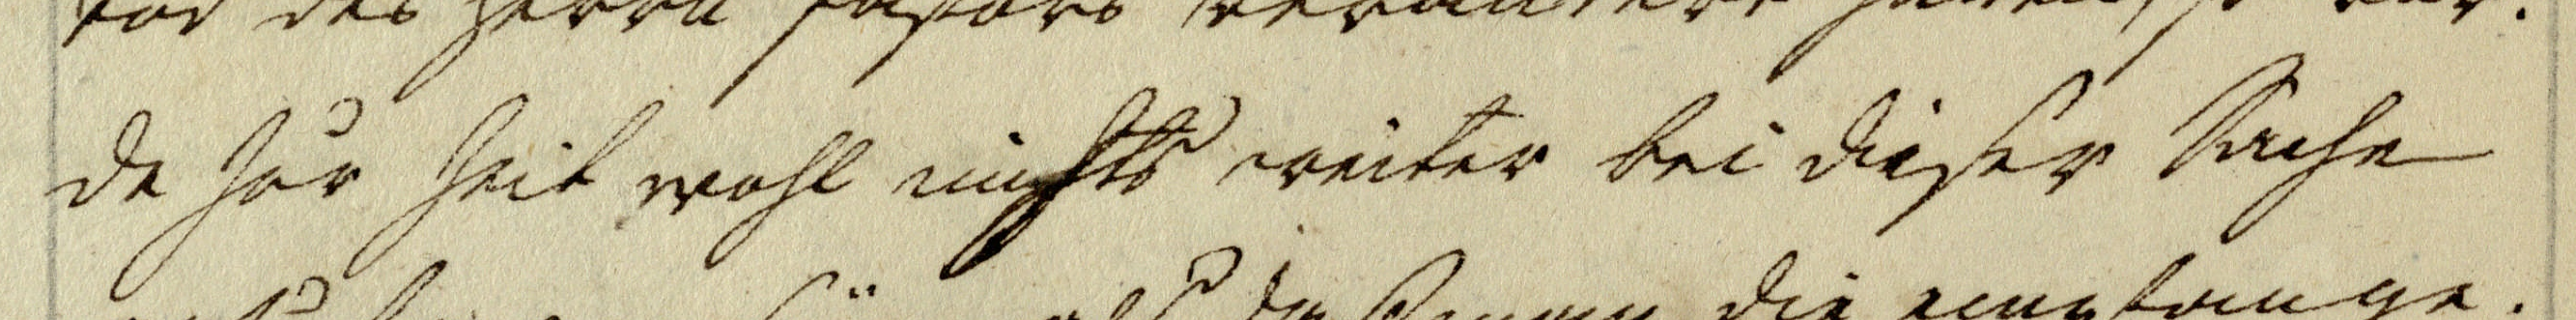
de zur Zeit wohl nichts weiter bei dieser Sache
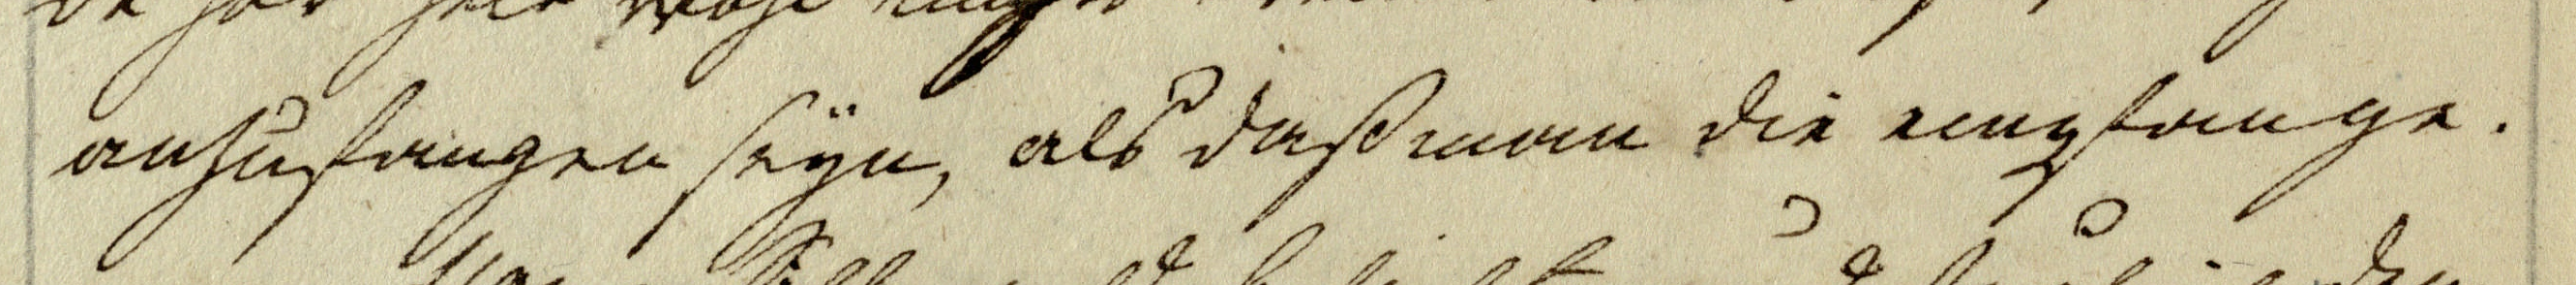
anzufangen seÿn, als daß man die empfange¬
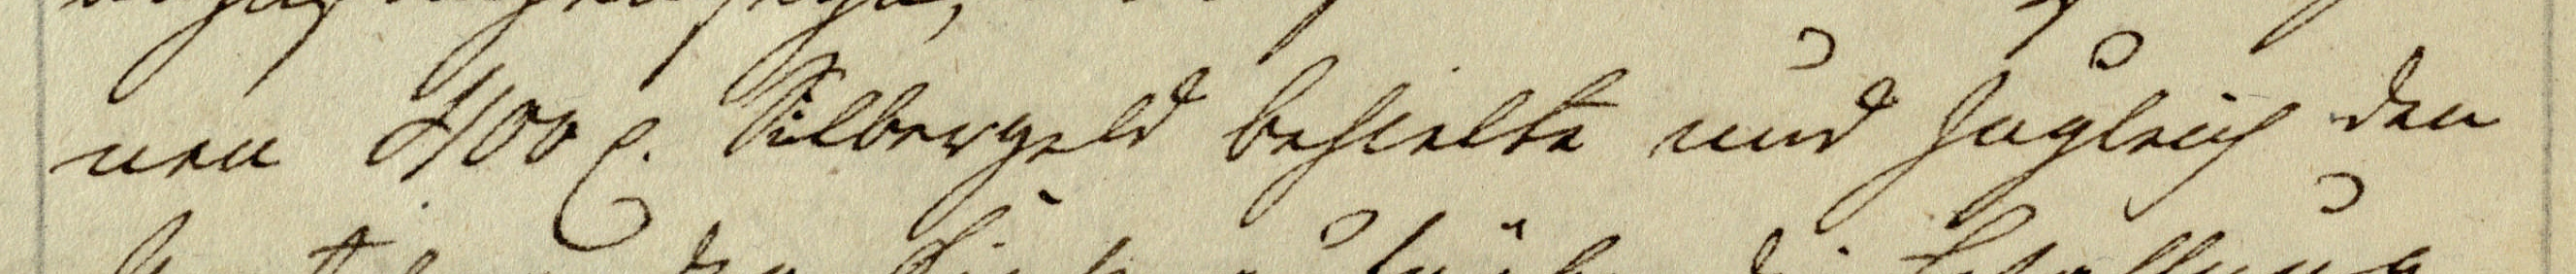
nen 400 l. Silbergeld behielte und zugleich den
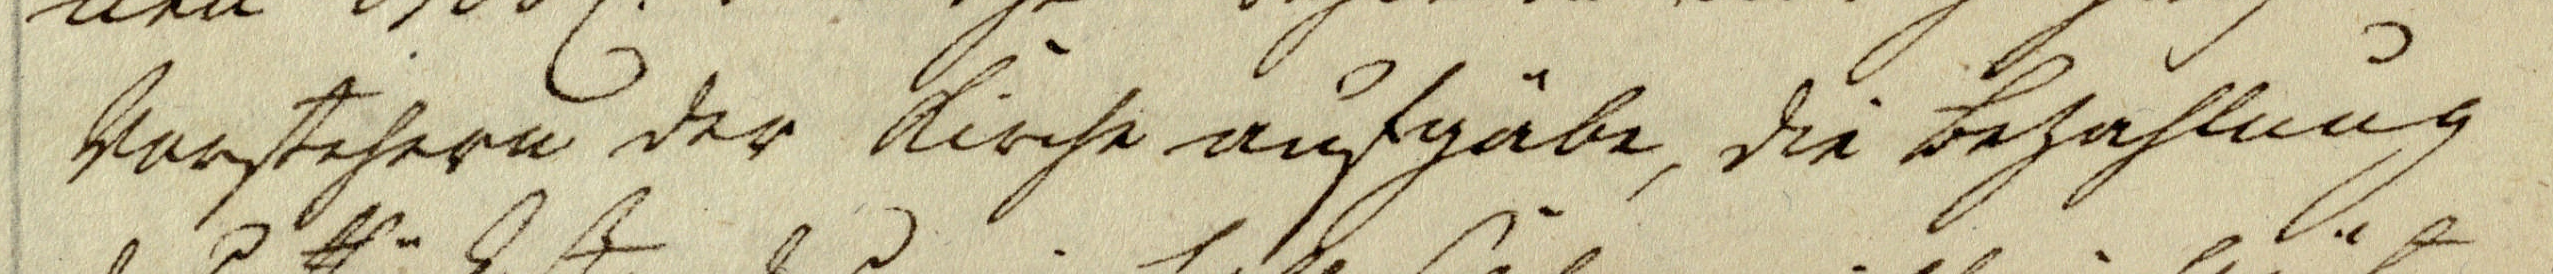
Vorstehern der Kirche aufgäbe, die Bezahlung
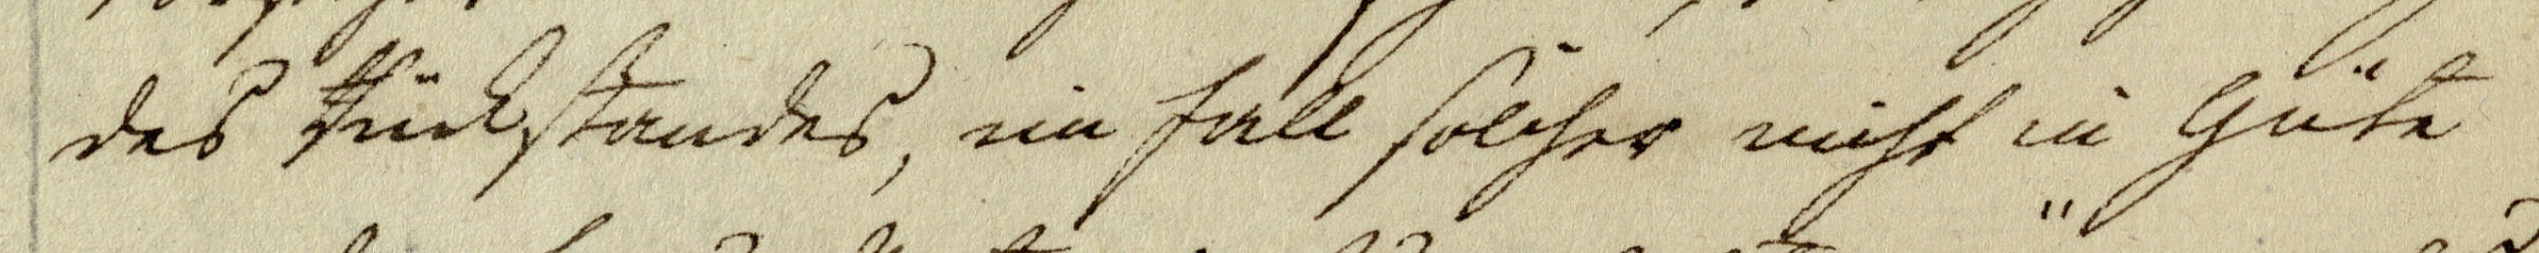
des Rückstandes, im Fall solcher nicht in Güte
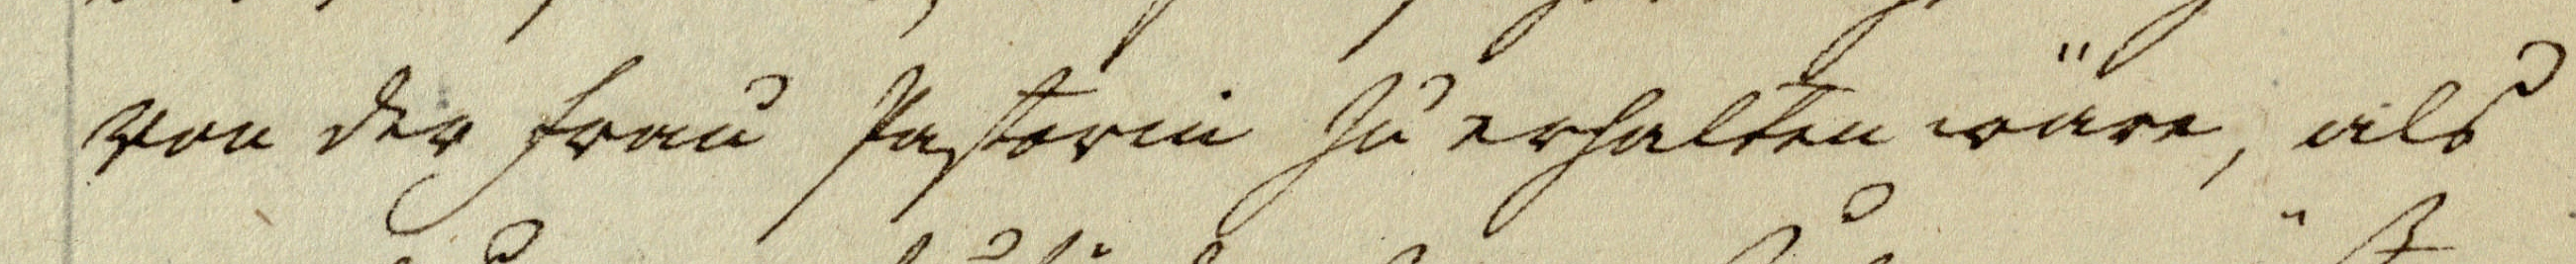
von der Frau Pastorin zu erhalten wäre, als
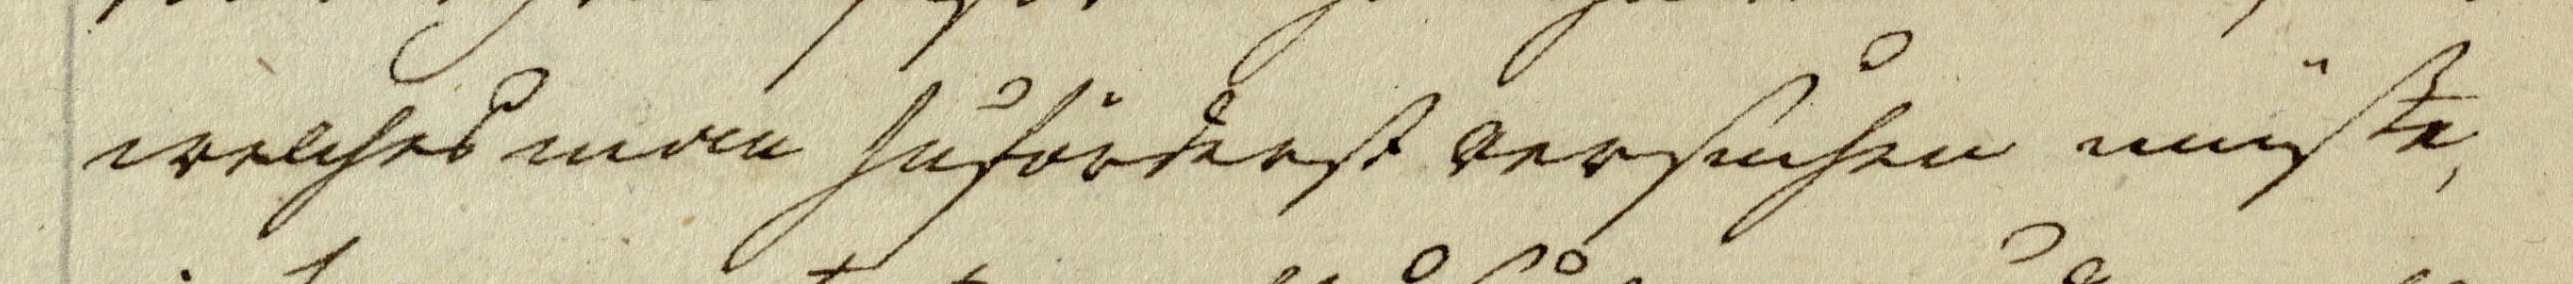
welches man zuförderst versuchen müßte,
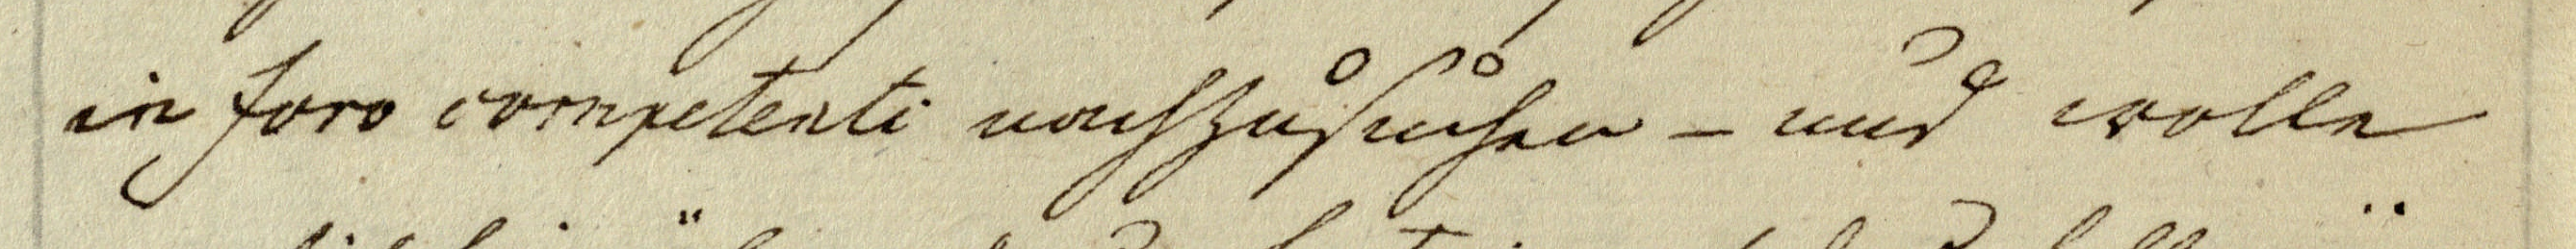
in foro competenti nachzusuchen - und wolle
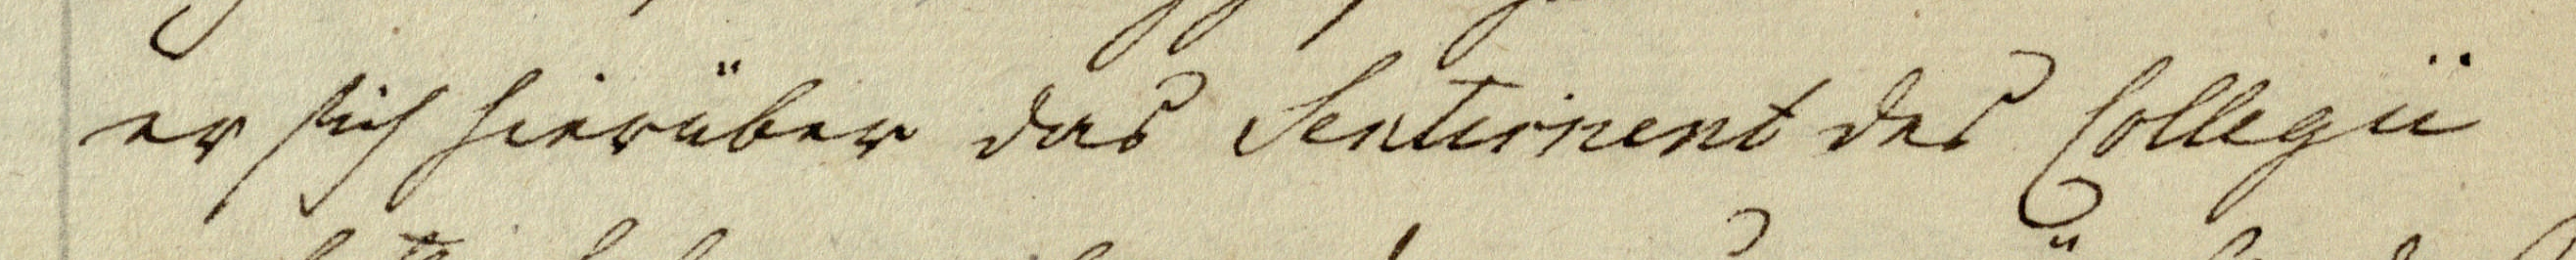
er sich hierüber das Sentiment des Collegii
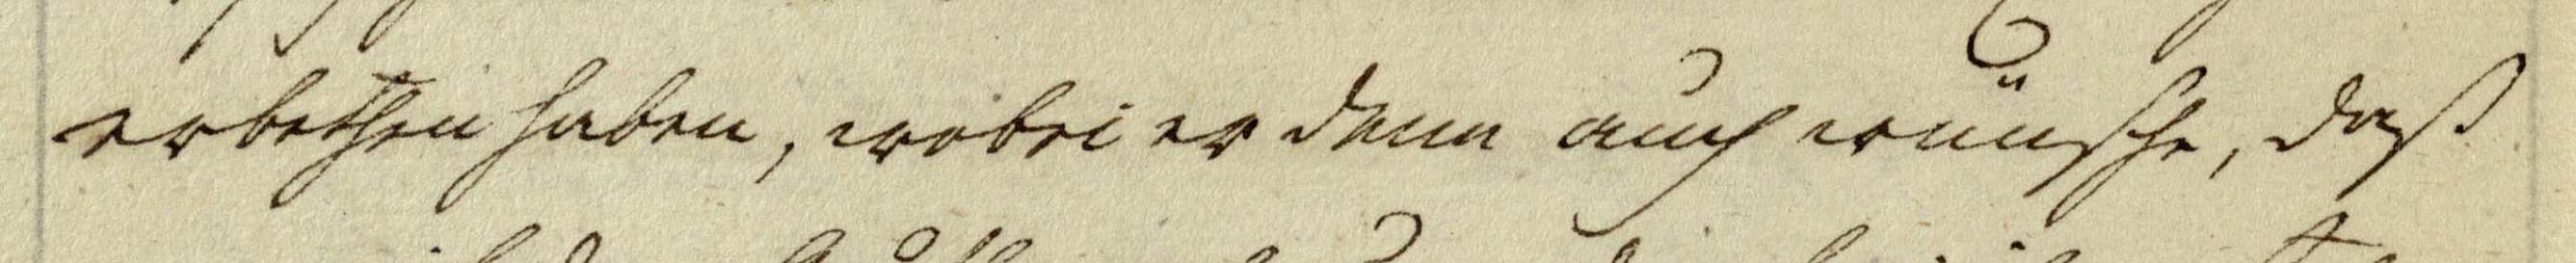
erbethen haben, wobei er denn auch wünsche, daß
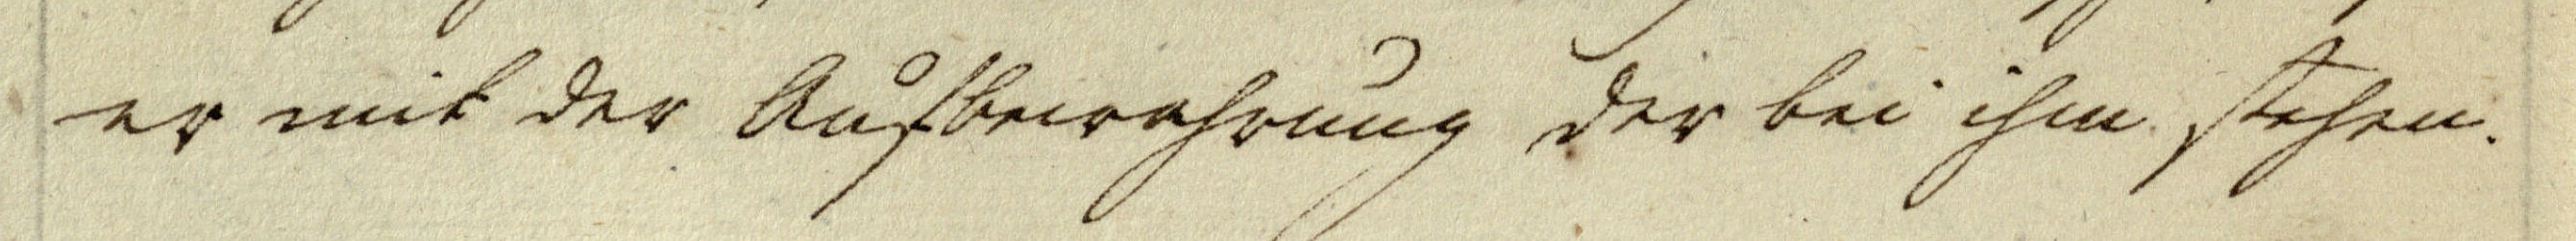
er mit der Aufbewahrung der bei ihm stehen¬
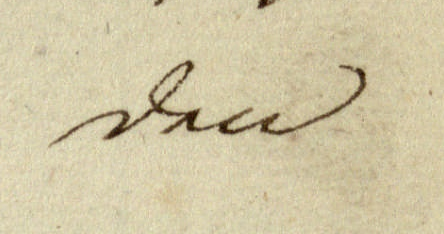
den
